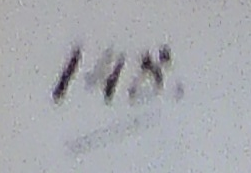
148.
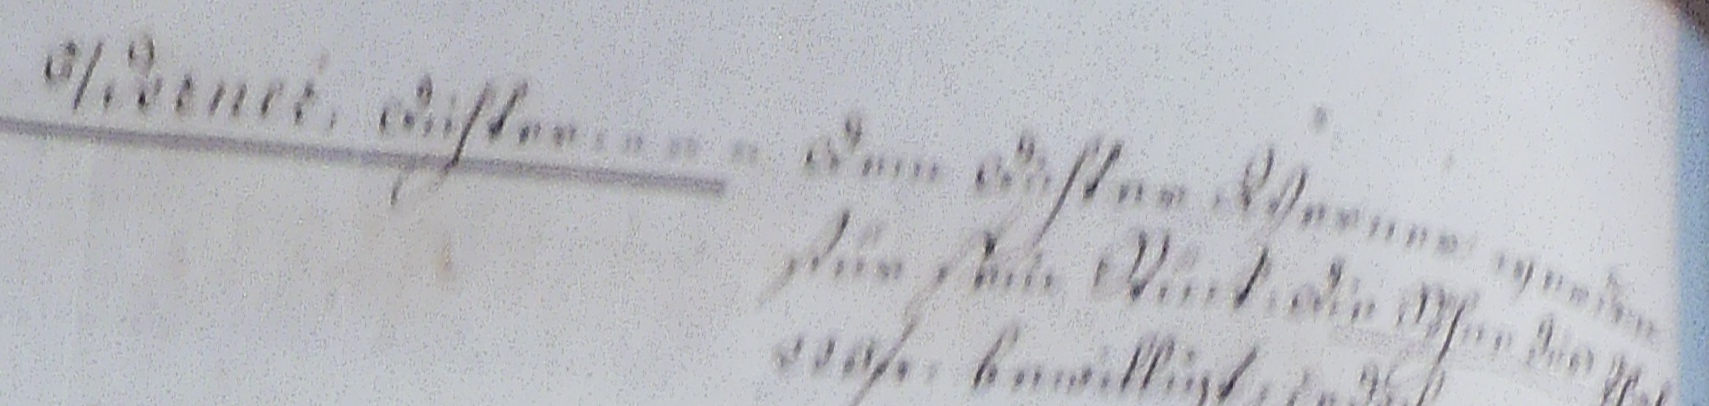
Werner, Dichter. .. .. .. Dem Dichter Werner werden
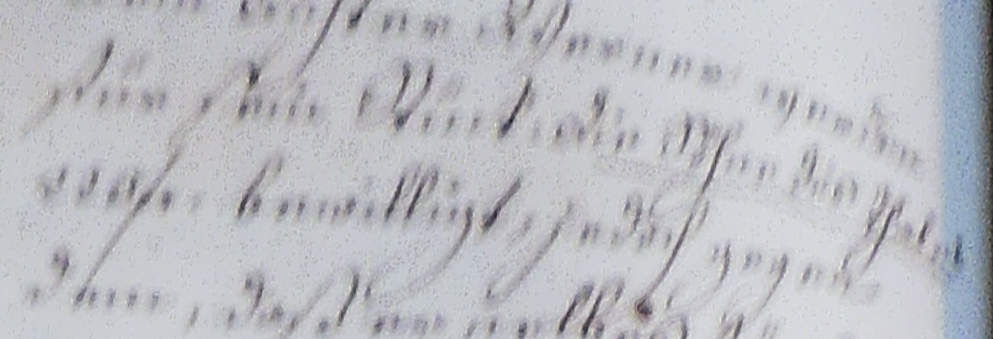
für sein Stück: Die Söhne des Thales
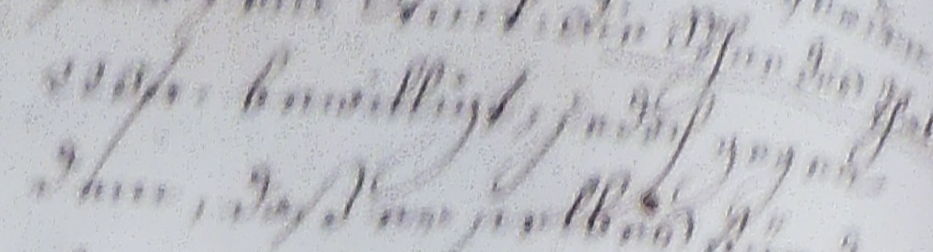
300fr. bewilligt, jedoch gegen¬
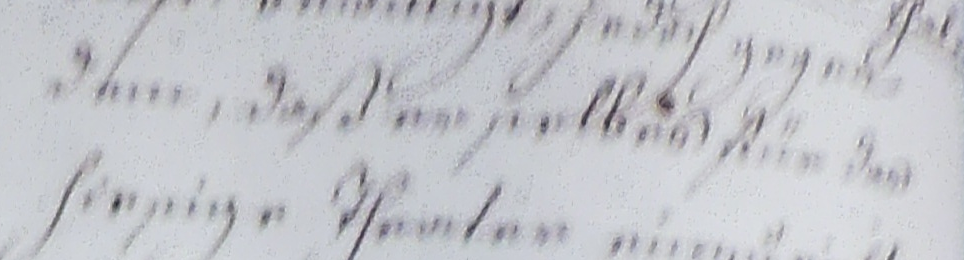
dem, daß er selbes für das
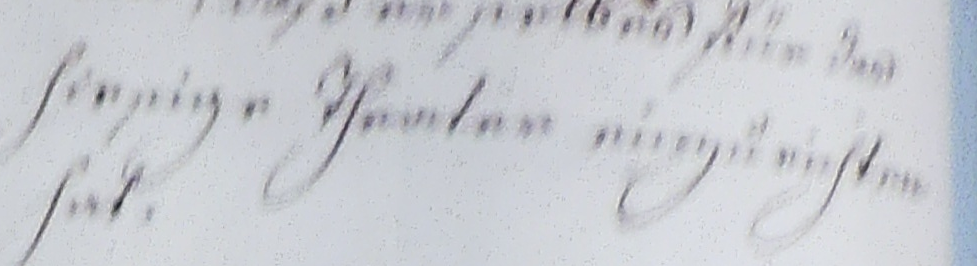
hiesige Theater einzurichten
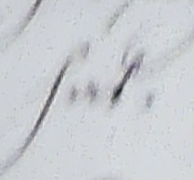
hat.
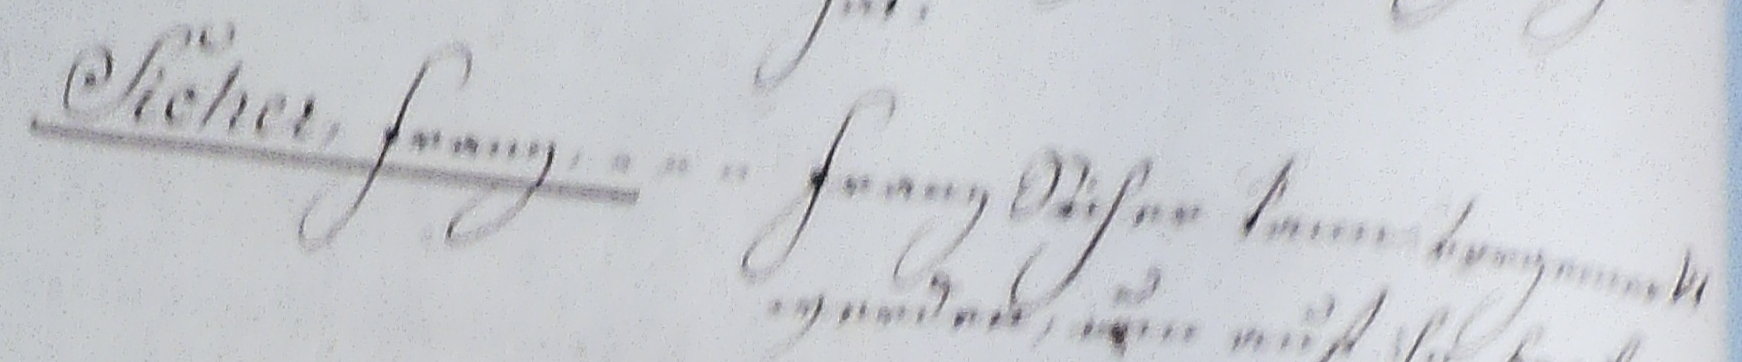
Sicher, Franz. .. .. .. Franz Sicher kann vorgemerkt
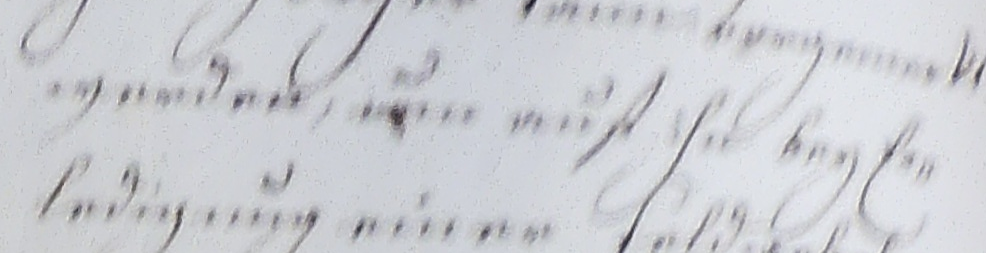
werden, um auf ihn bey Er¬
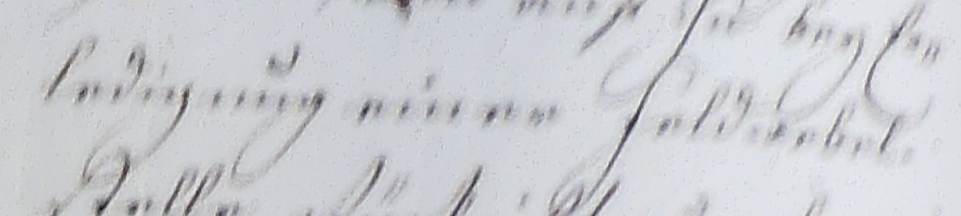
ledigung einer Feldwebel¬
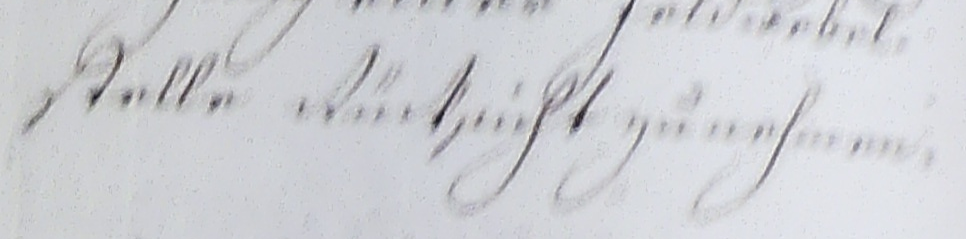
stelle Rücksicht zunehmen.
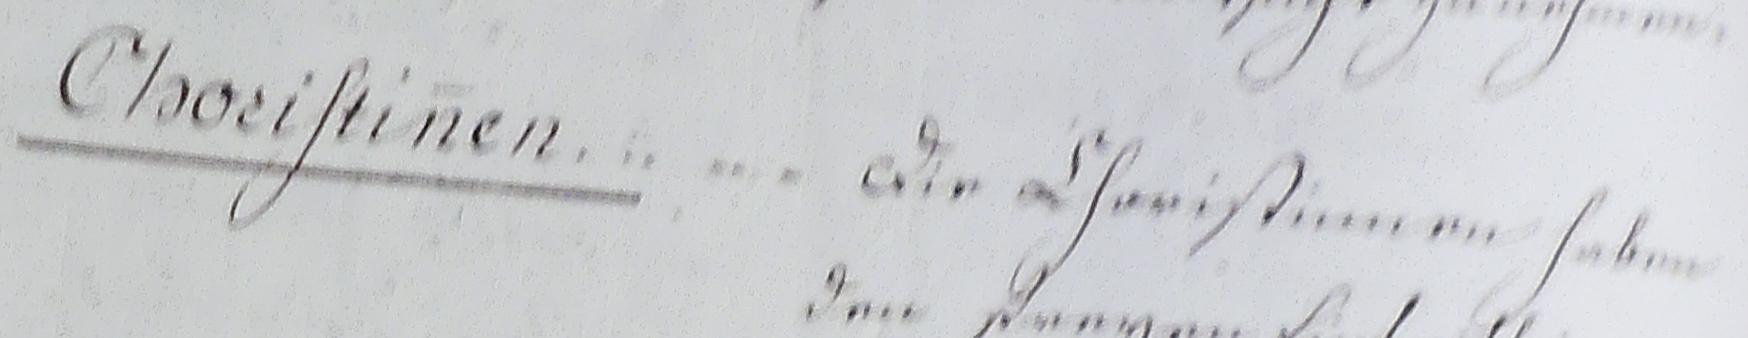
Choristin̅en. .. .. .. Die Chorstinnen haben
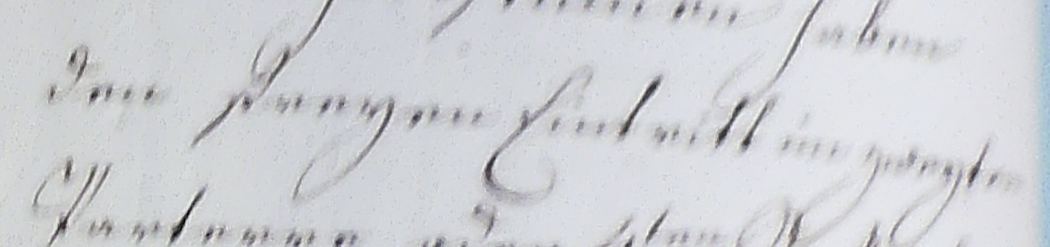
den freyen Eintritt im zweyt.
